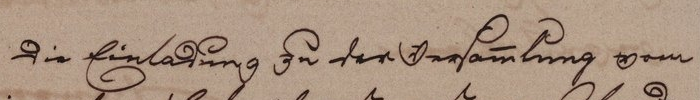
Die Einladung zu der Versammlung vom
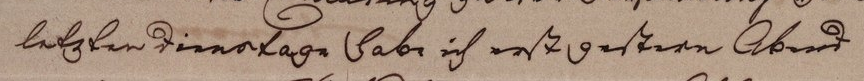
letzten Dienstage habe ich erst gestern Abend
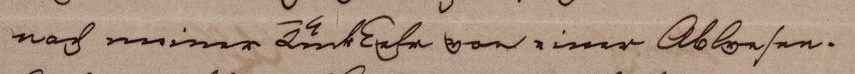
nach meiner Rückkehr von einer Abwesen-
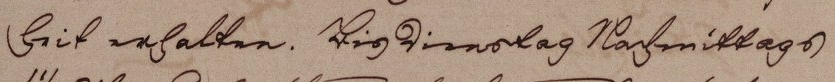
heit erhalten. Bis Dienstag Nachmittags
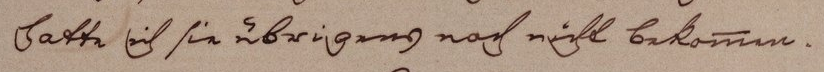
hatte ich sie übrigens noch nicht bekommen.
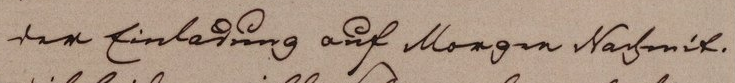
Der Einladung auf Morgen Nachmit-
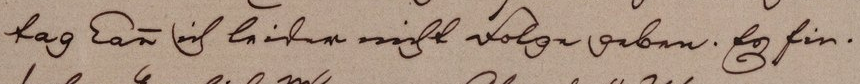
tag kann ich leider nicht Folge geben. Es fin-
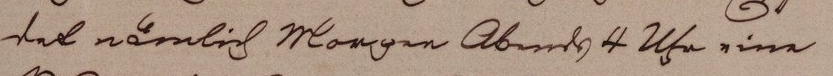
det nämlich Morgen Abends 4 Uhr eine
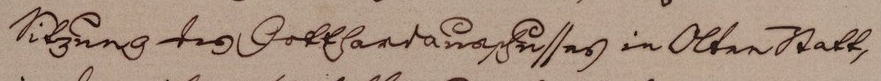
Sitzung des Gotthardausschusses in Olten Statt,
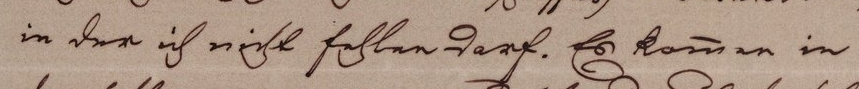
in der ich nicht fehlen darf. Es kommen in
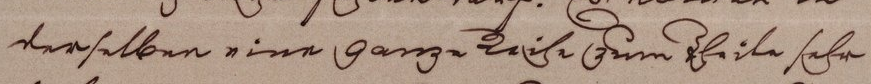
derselben eine ganze Reihe zum Theile sehr
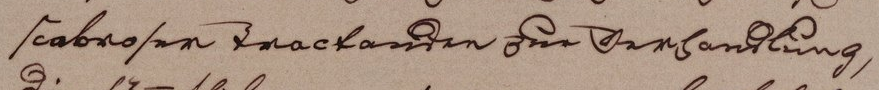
scabroser Tractanden zur Verhandlung,
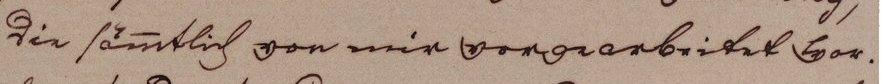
die sämmtlich von mir vorgearbeitet wor-
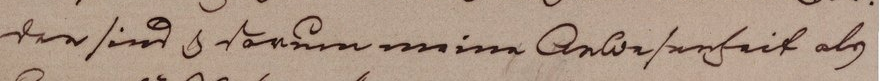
den sind & darum meine Anwesenheit als
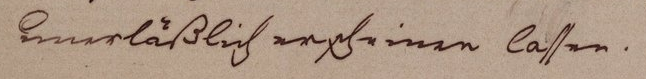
unerläßlich erscheinen lassen.
